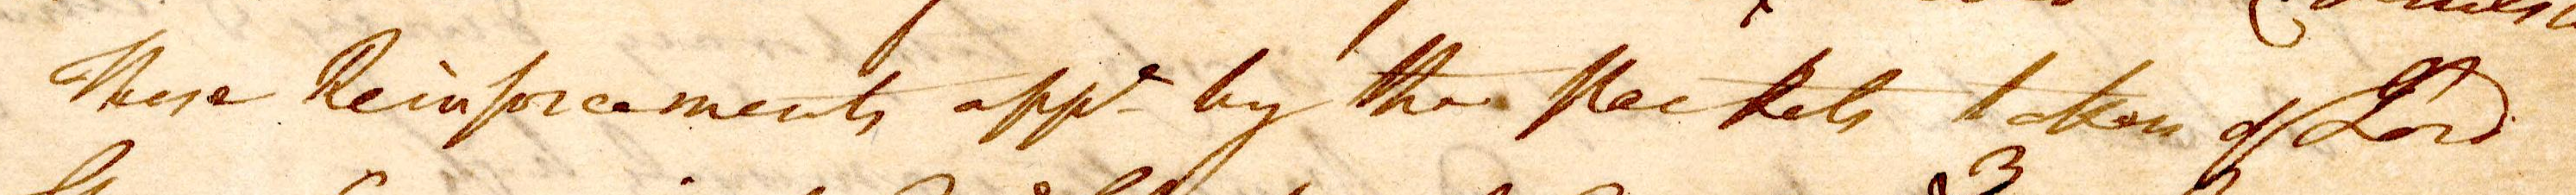These Reinforcements app^t by the packets & often of Lord
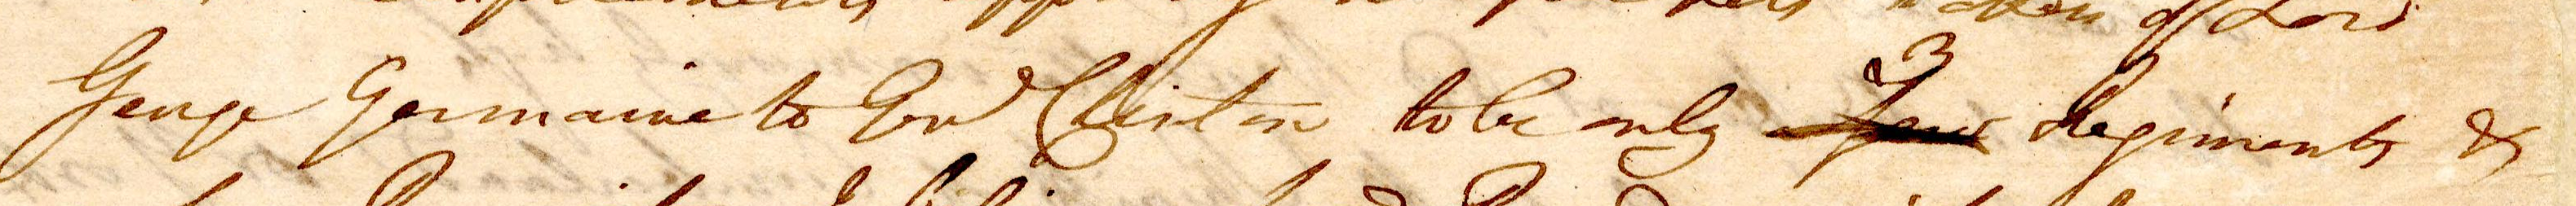George Germaine to Gen^l Clinton to be only ^ four Regiments &
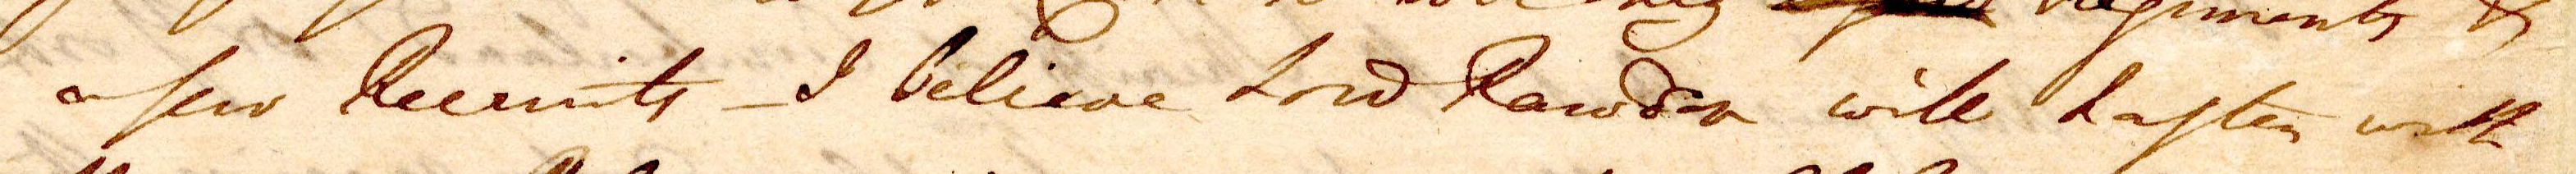a few Recruits. I believe Lord Rawson will hasten with
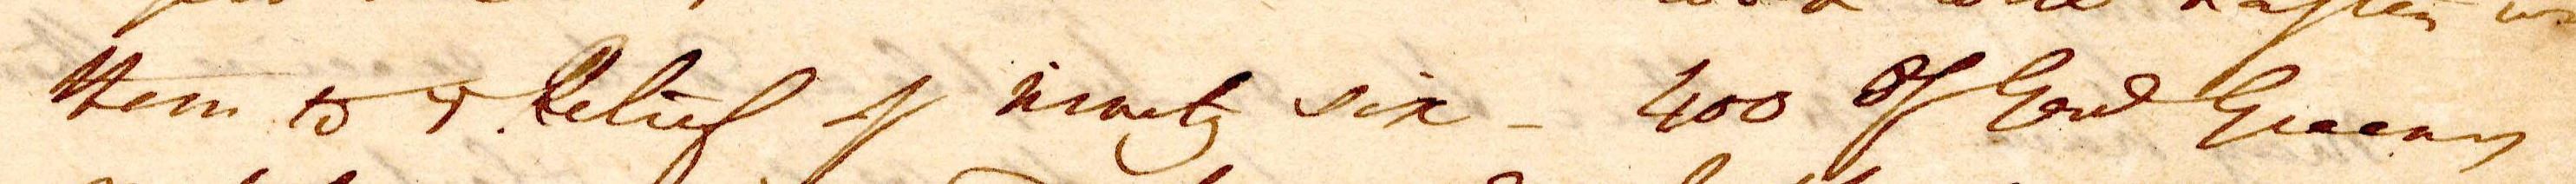them to y^e Relief of ninety six. 400 of Gen^l Greens
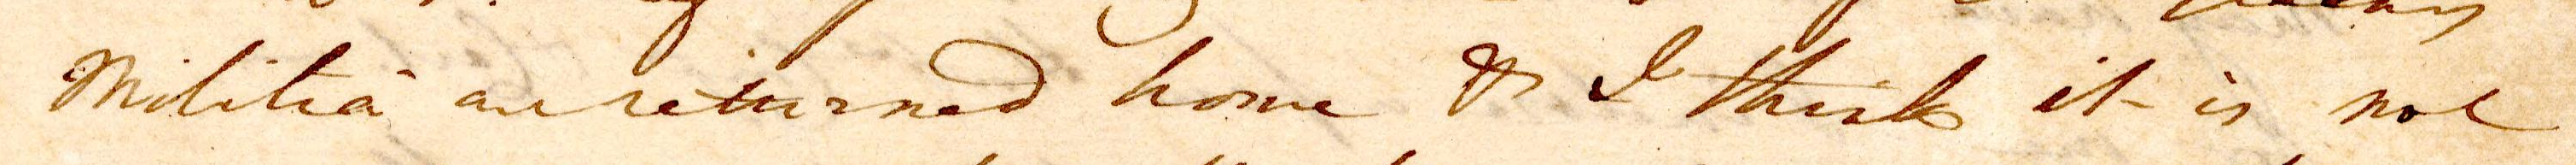Militia are returned home & I think it is not
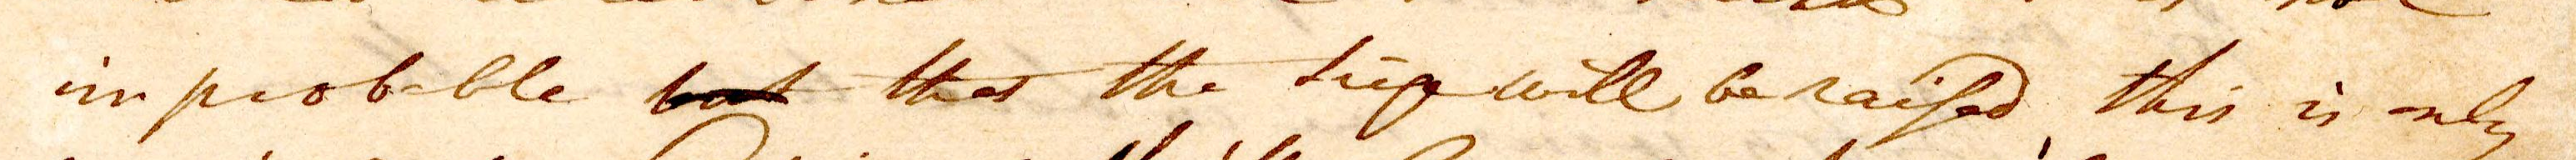improbable but that the Siege will be raised this is only
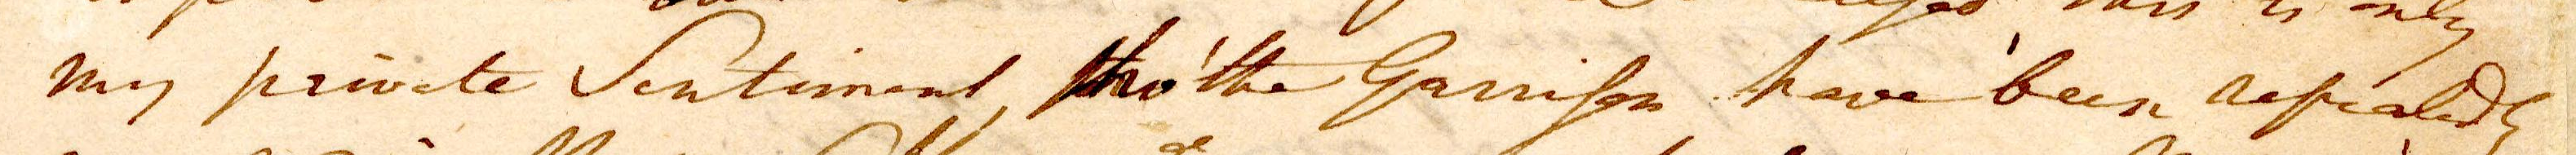my private Sentiment, tho' the Garrison have been repealed
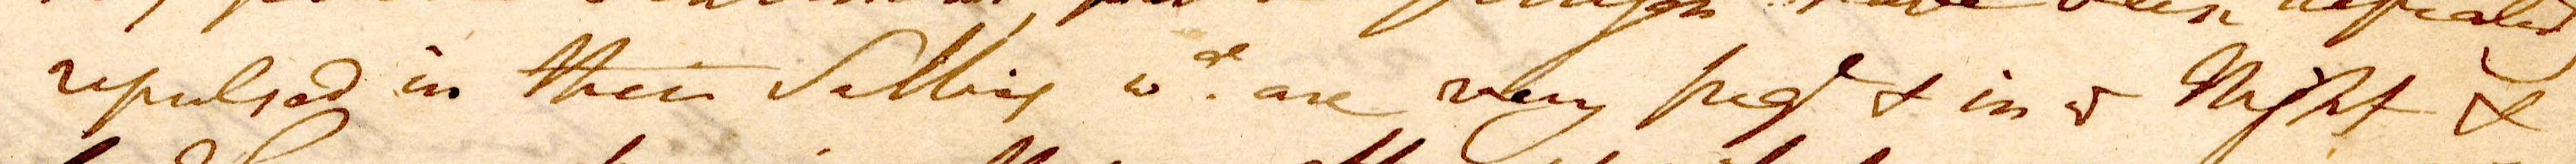repulsed in their Selbies w^h are very freq^t & in y^e Night &
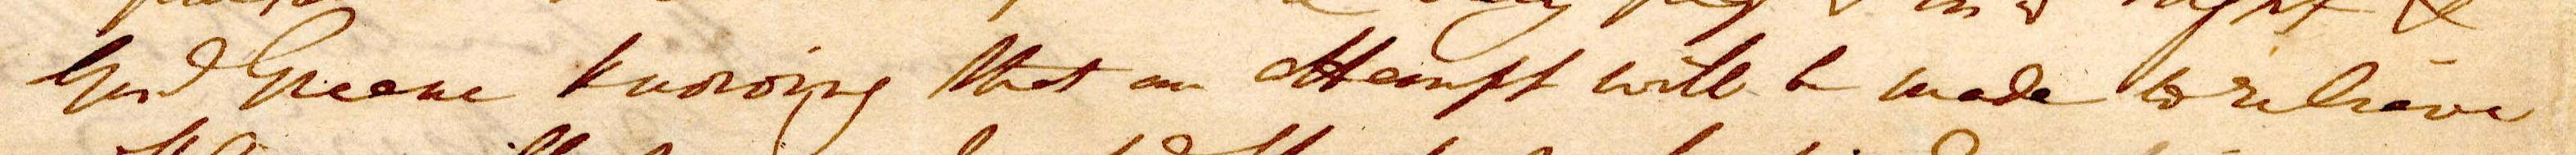Gen^l Grease knowing that an attempt will be made to relieve
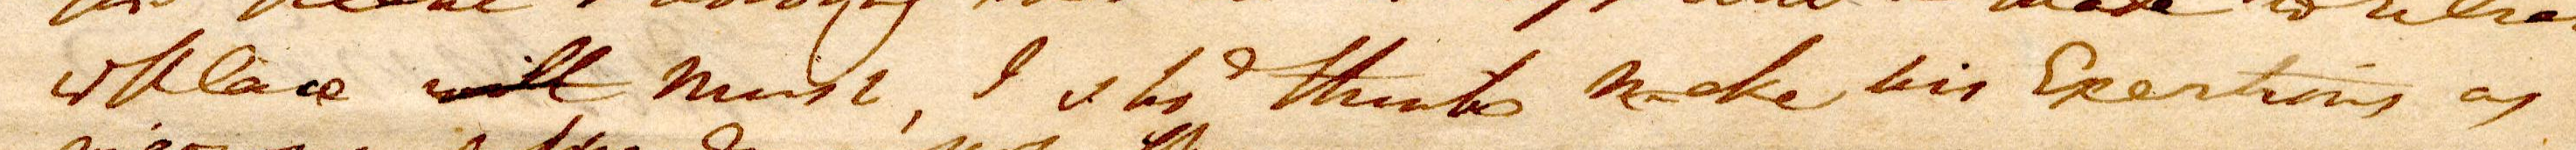y^e Place will must, I sho^d think make his Exertions as
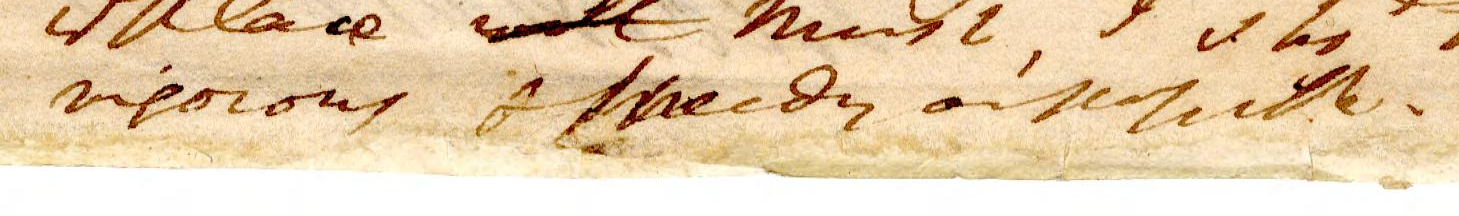vigorous & speedy as possible.
